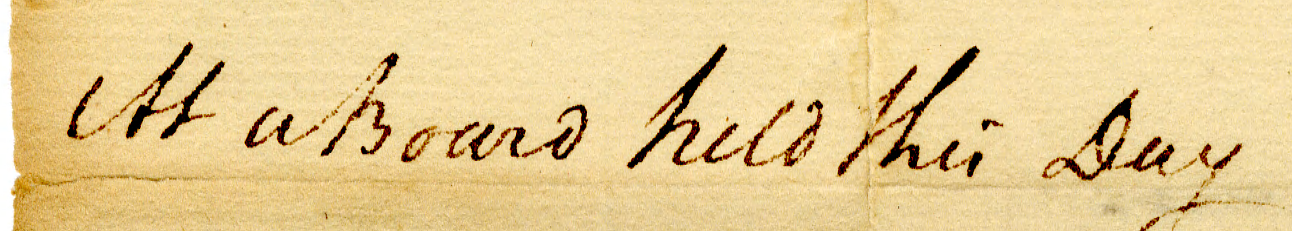At a Board held this Day
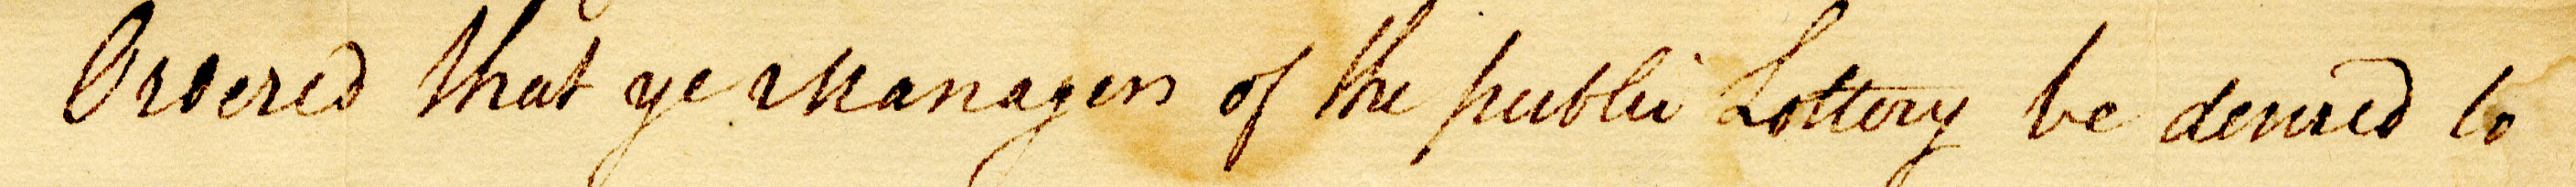Ordered that ye Managers of the public Lottery be denied to
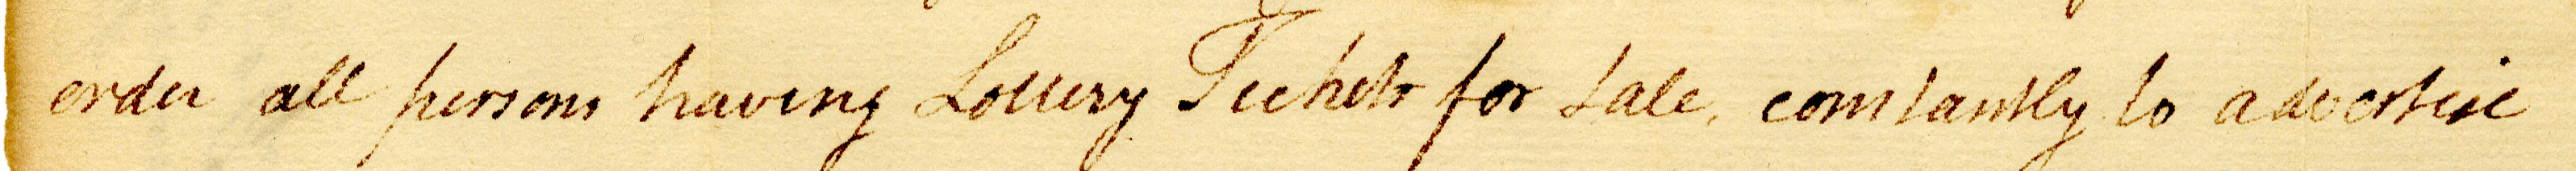order all persons having Lottery Tickets for sale, constantly to advertise
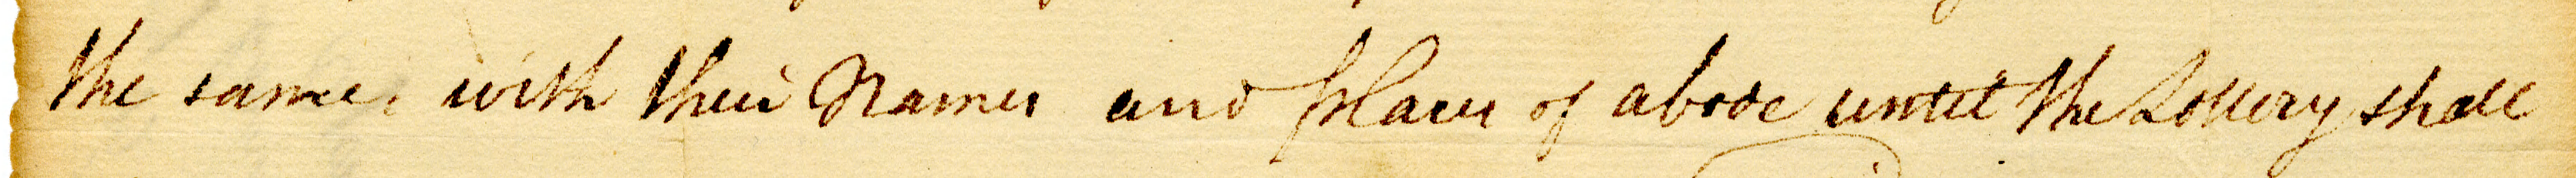the same, with their names and place of abode until the Lottery shall
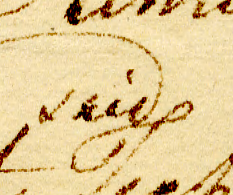said
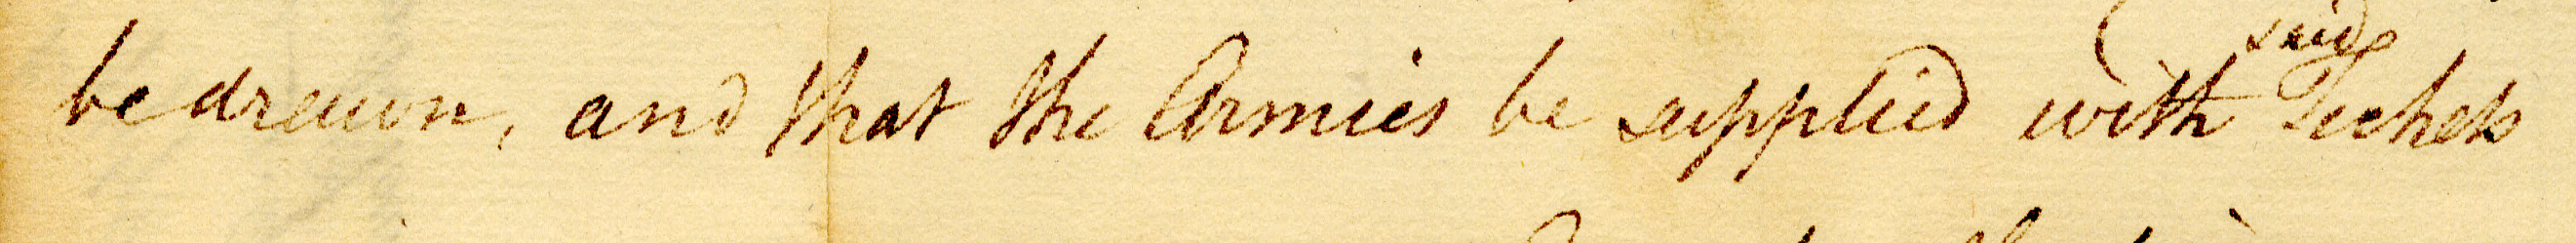be drawn, and that the Armies be supplied with ^said Tickets
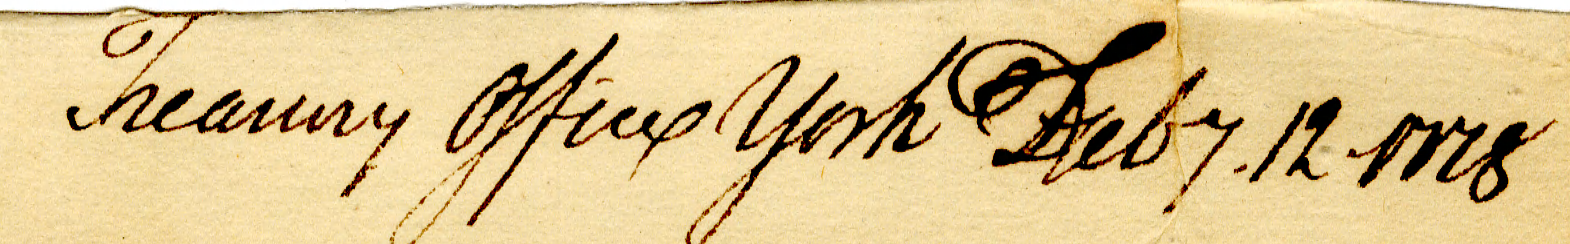Treasury Offices York Feb^r. 12 1778
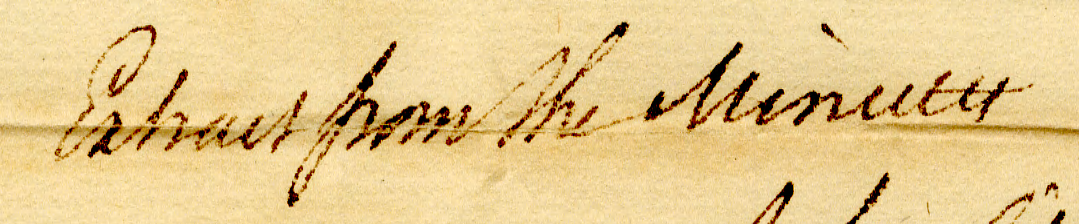Extract from the Minutes
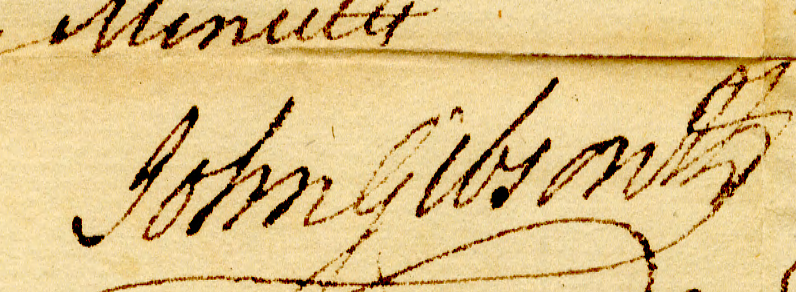John Gibson
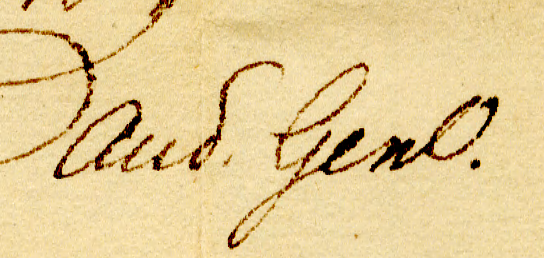And. Genl.
